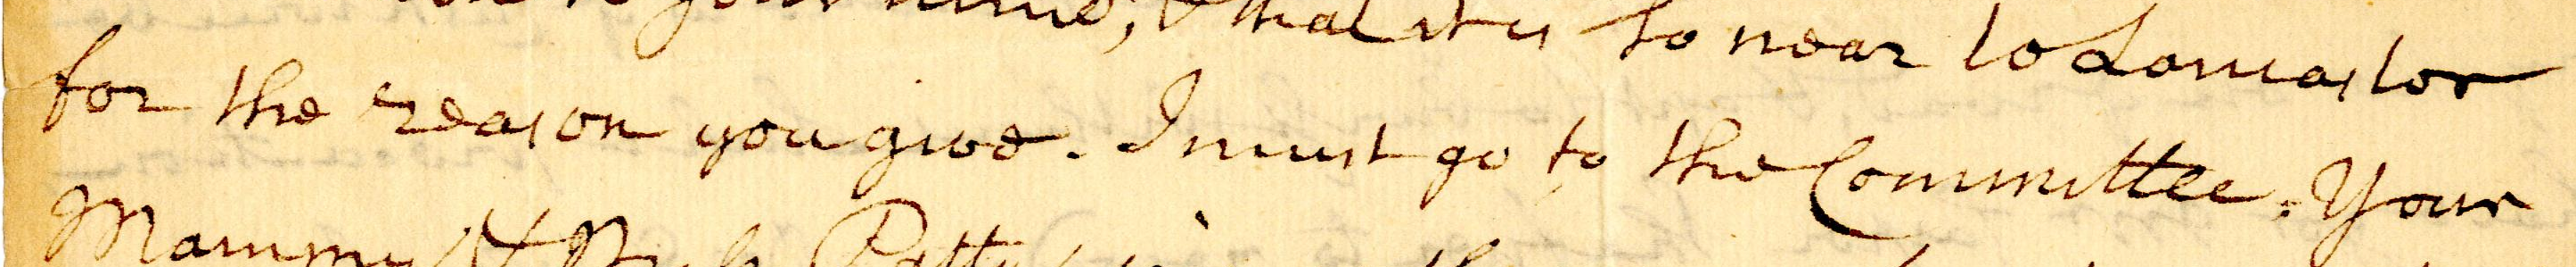for the reason you give. I must go to the Committee. Your
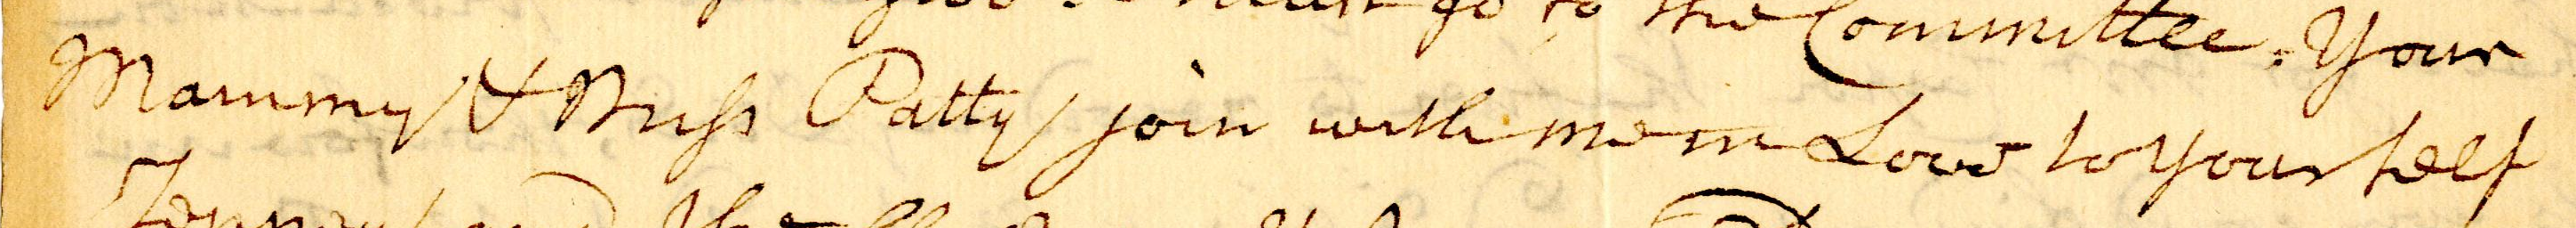Mammy & Miss Patty join with me in Love to Your self
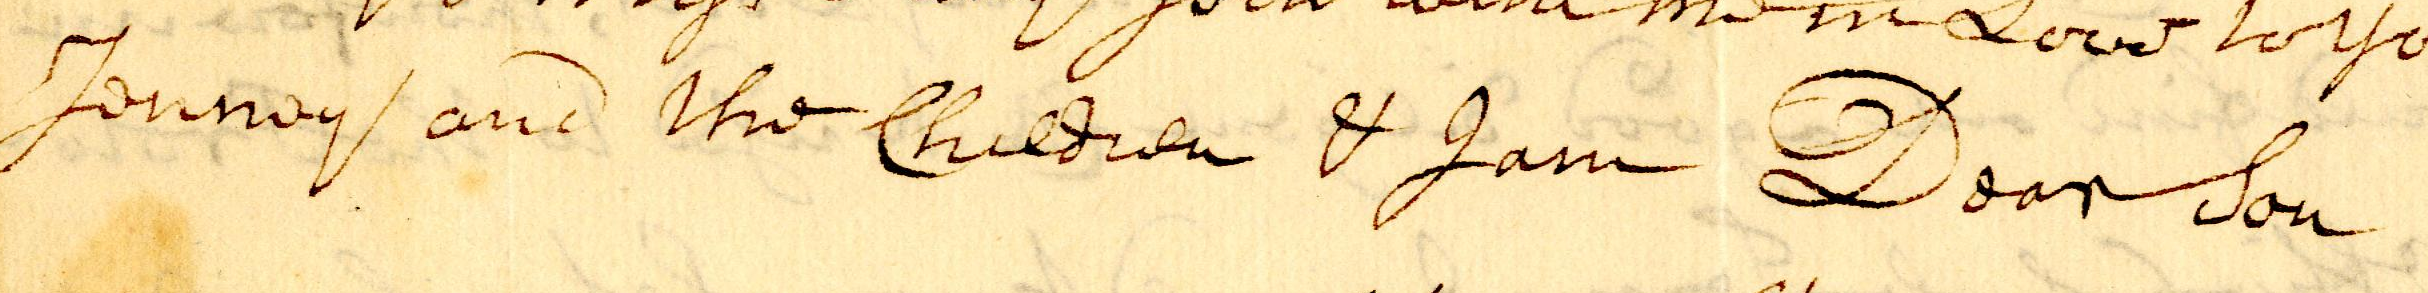Jenney and the Children & I am Dear Son
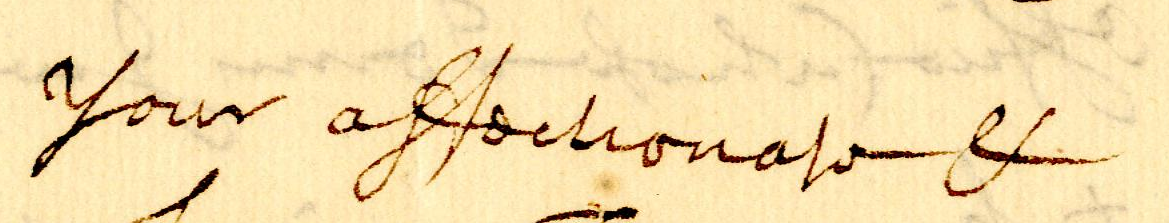Your affectionate &
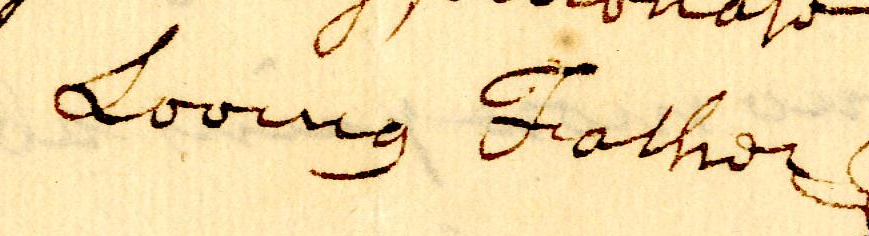Loving Father
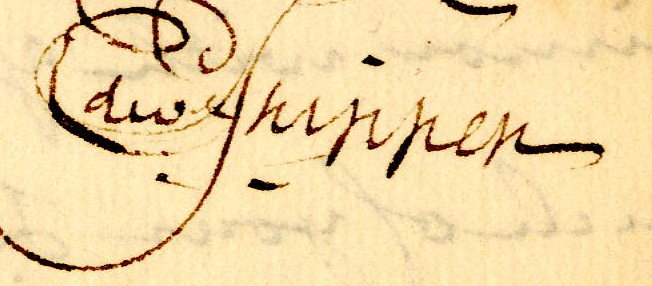Edw Shippen
